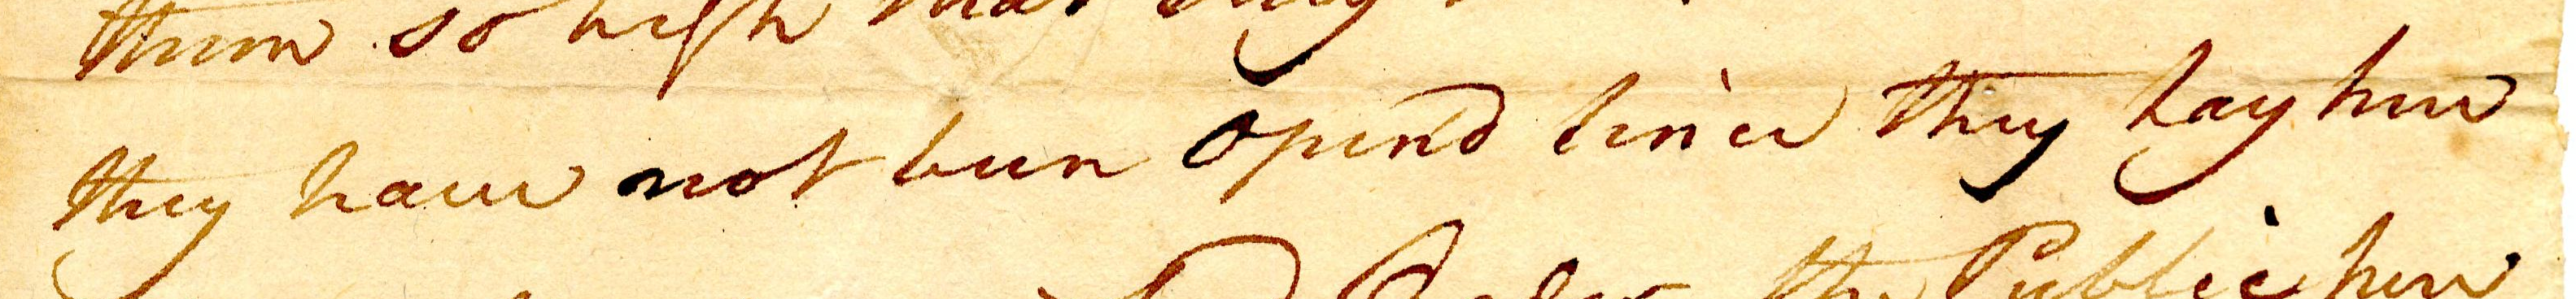they have not been opend linen they Lay here
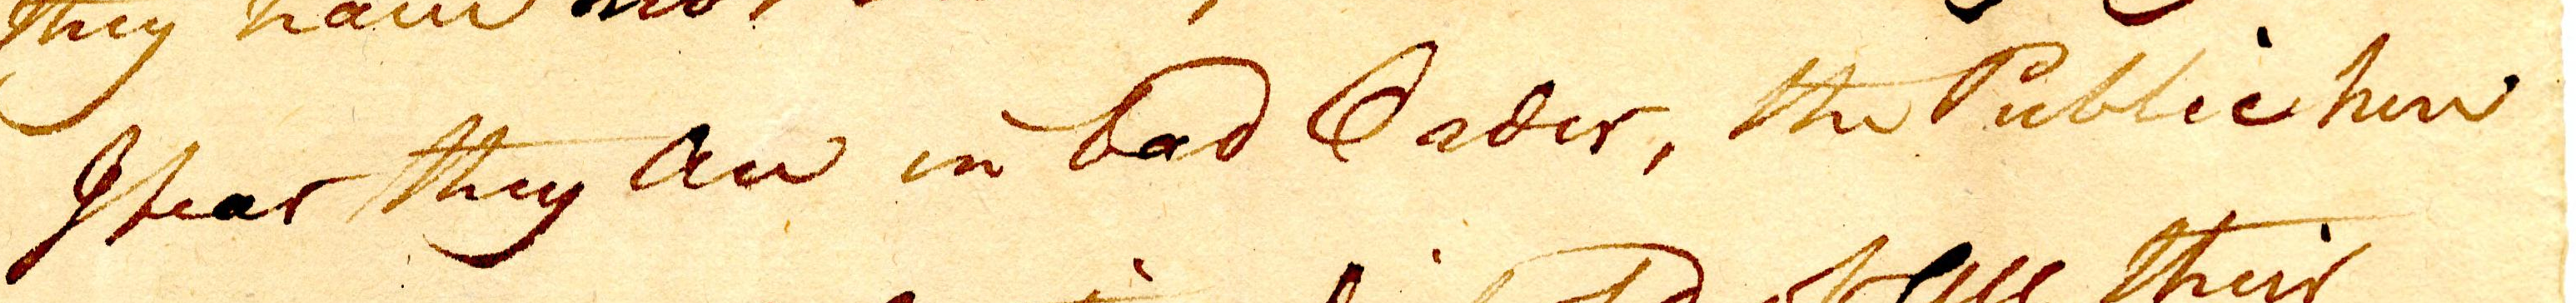I hear they are in bad Order, the Public here
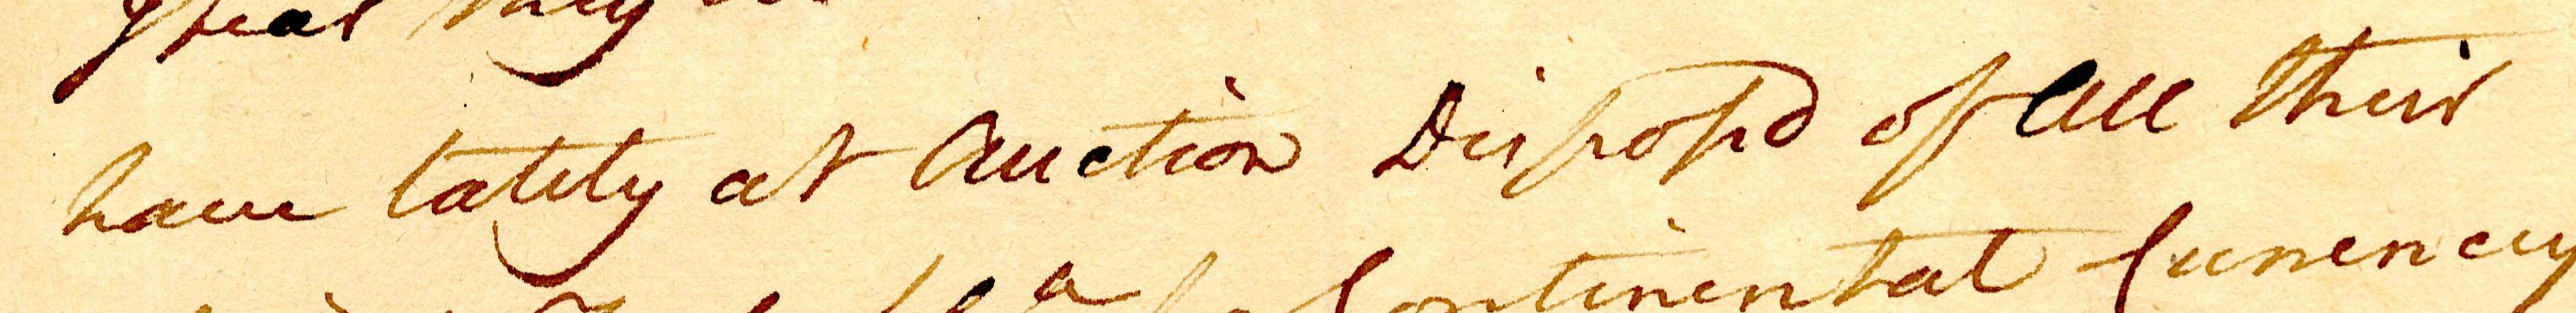have lately at Auction Disposd of All their
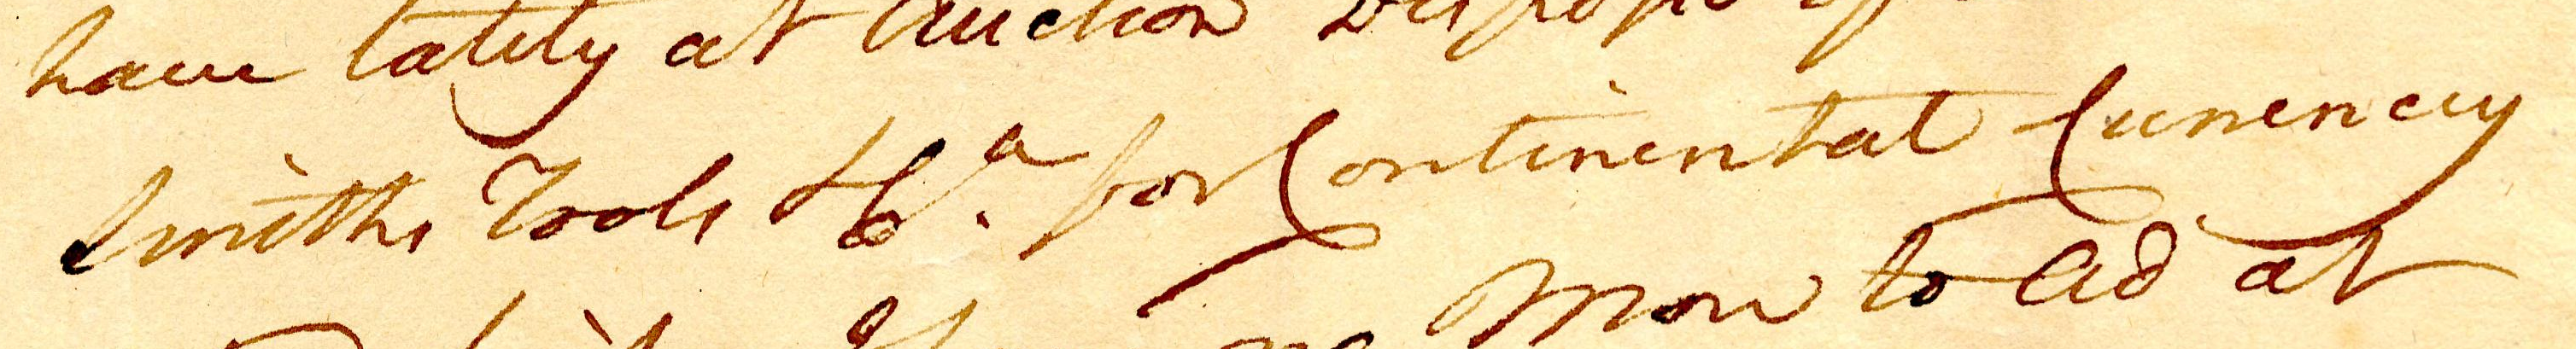Smiths Tools & C^a. for Continental Currency
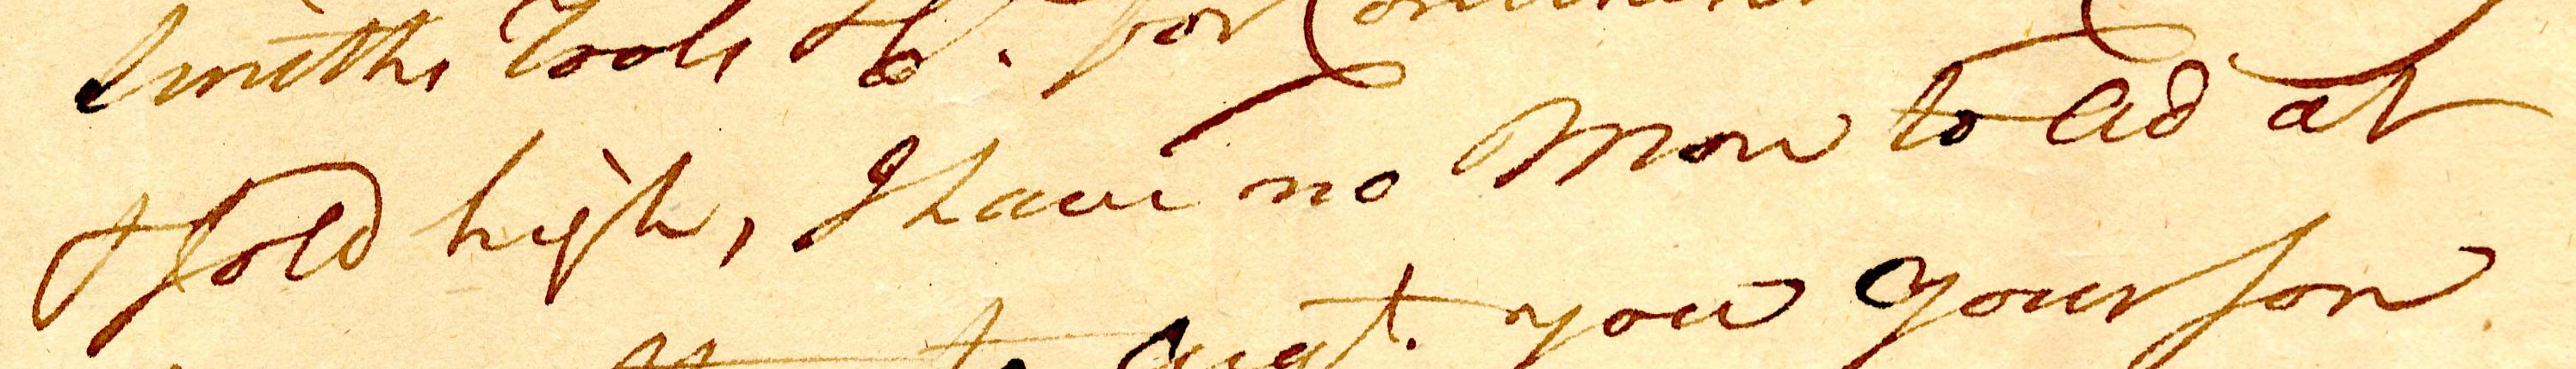& sold high, I have no More to Ad at
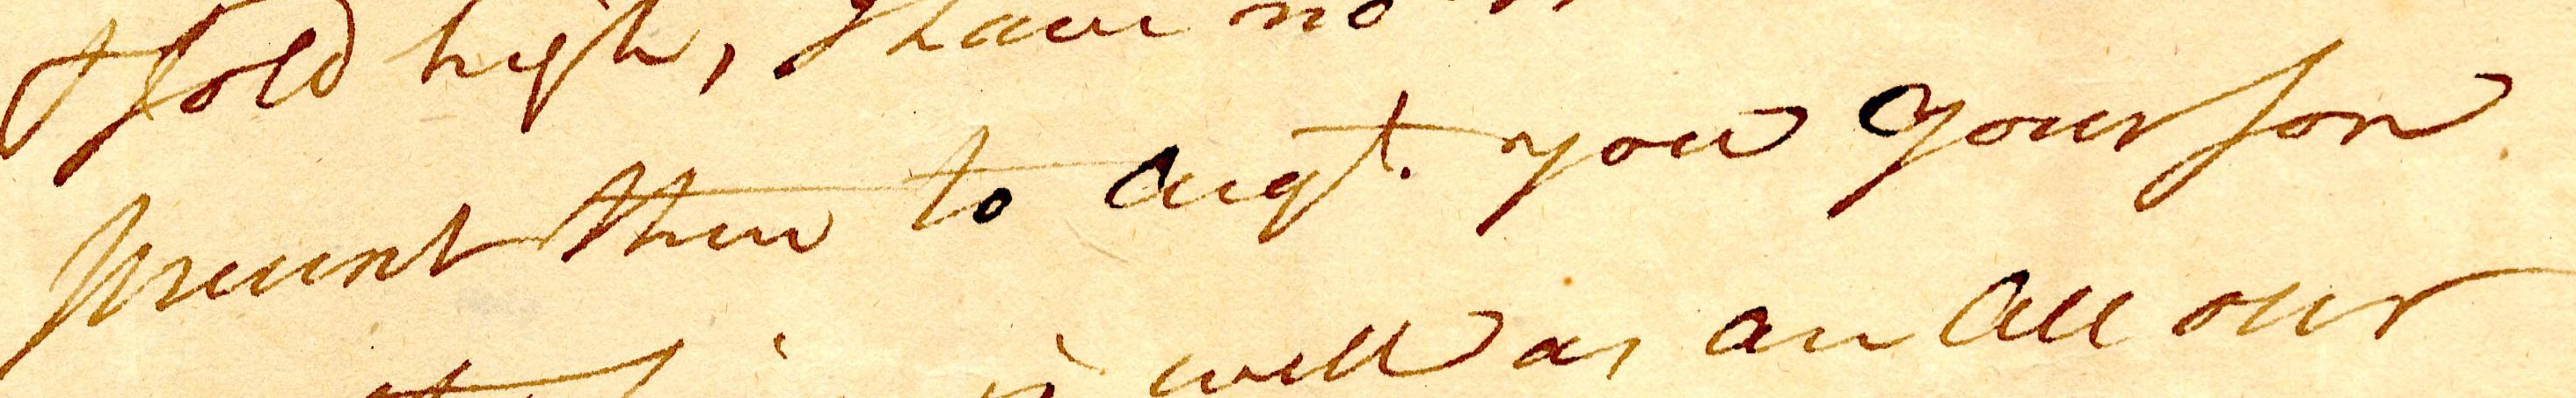present then to acq^t. you Your son
